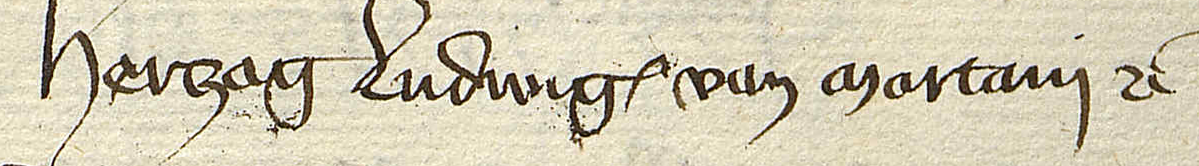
Hercʒog Ludwig* von Mortani ec*
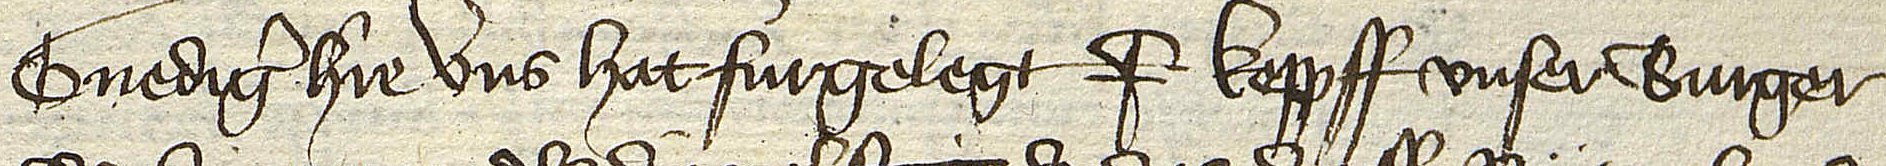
Gnedig* h*re Vns hat fürgelegt F . keppff vnſer Burger
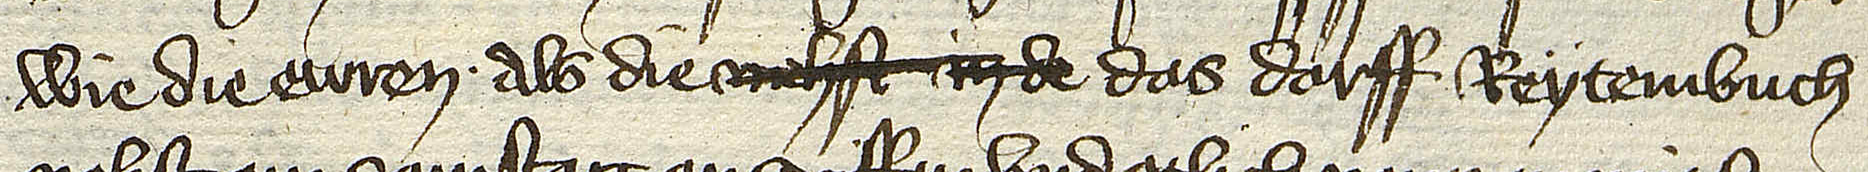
wie die ewren . Als die nehſt in de das dorff Reytembuch
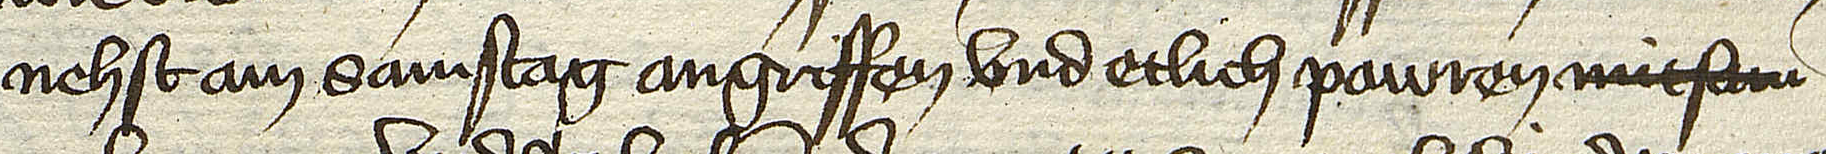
nehſt am Samſtag angriffen vnd etlich pauren mit ſam
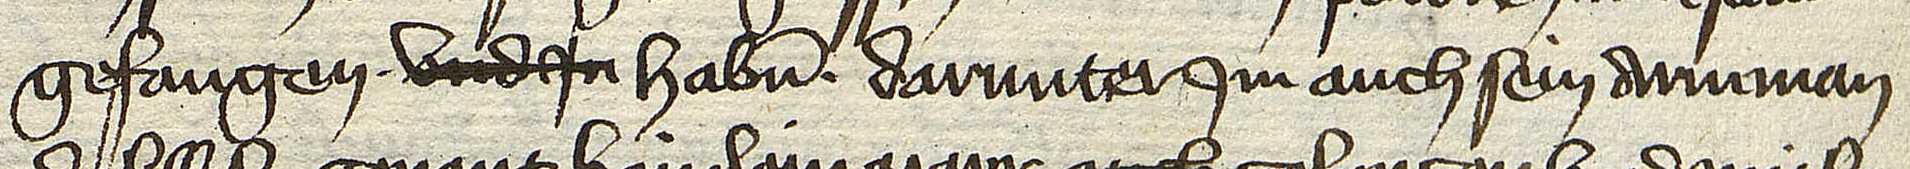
gefangen . vnd In hab*n . darunter Im auch ſein Armman
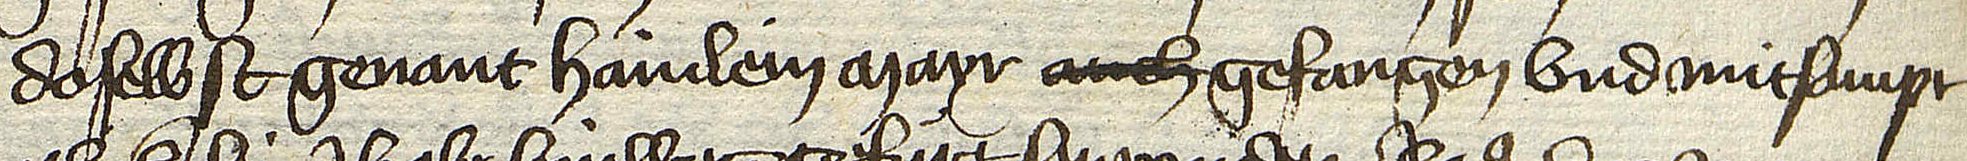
doſelbſt genant Hainlein Mayr auch gefangen vnd mitſampt
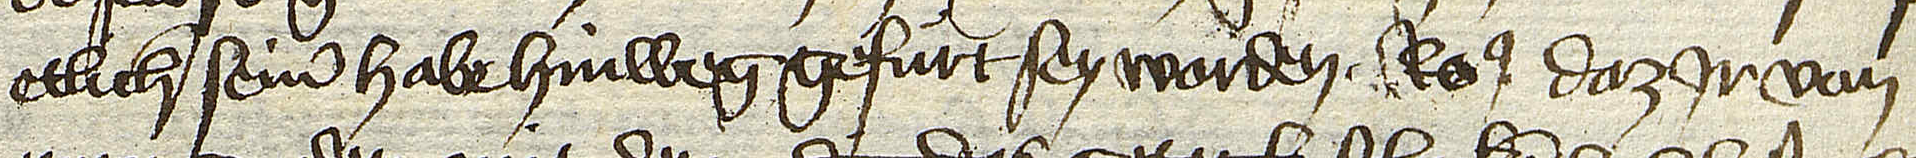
etlich* ſein* habe hinweg gefürt ſey worden . Ro* . daʒ Ir von
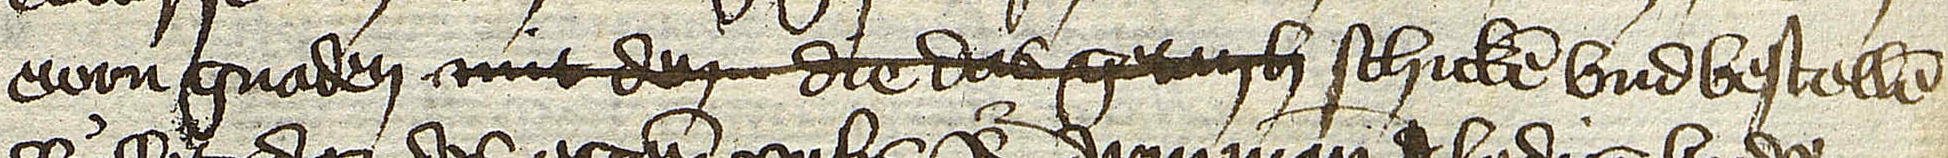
ewrn gnaden mit den die das getan h ſchicke* vnd beſtelle*
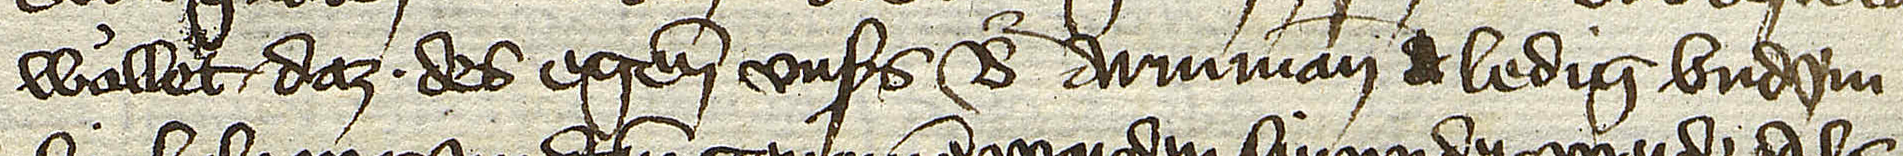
wöllet / daʒ . des egen* vnſ*s B* Armman* d ledig vnd Im
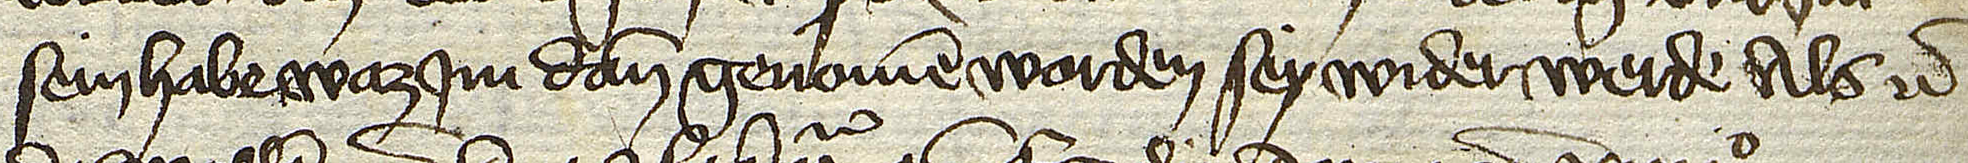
ſein habe waʒ Im dan* genome* worden ſey wider werde Als ec*
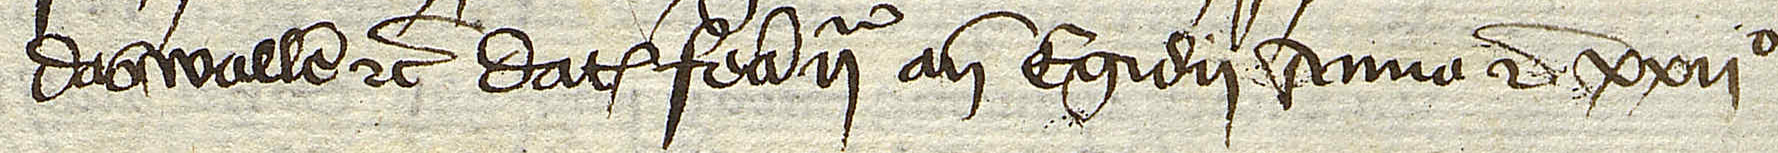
das wolle* ec* Dat* fea* ii* an* Egidii* Anno ec* xxii*
